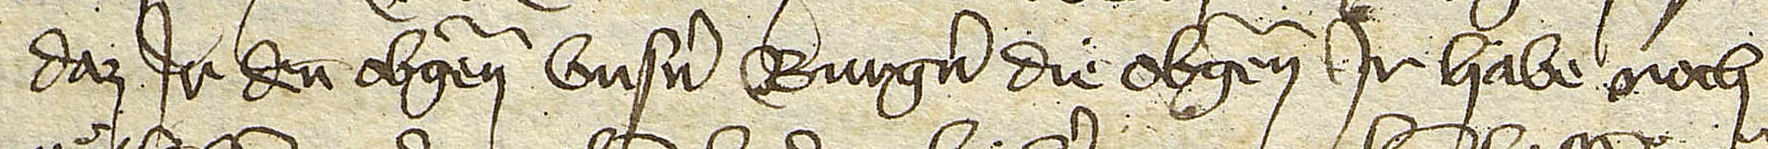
daʒ Ir den obgen* vnſn* Burgn* die obgen* Ir habe noch
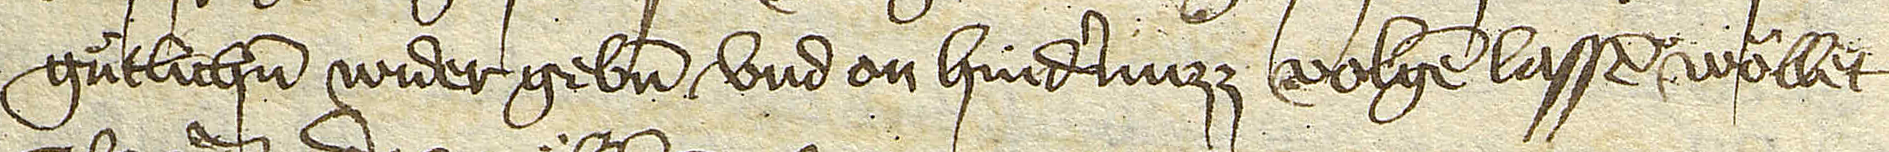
gütlichn* wider gebn* / vnd on hind*nuʒʒ volge* laſſe* wöllet
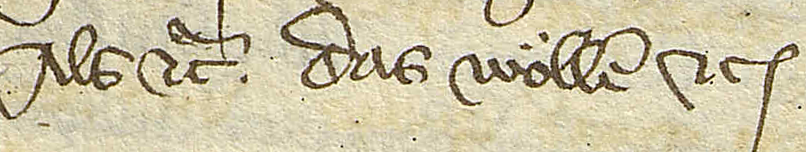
Als ec* . das wölle* ec*
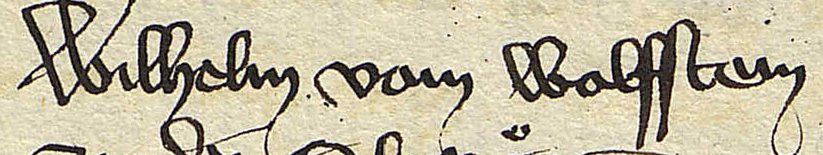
Wilhelm vom wolfſtein
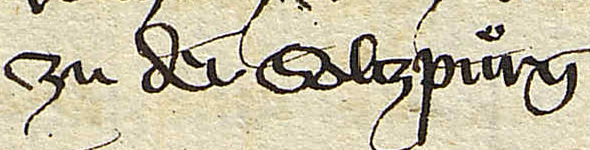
cʒu der Salcʒpürg
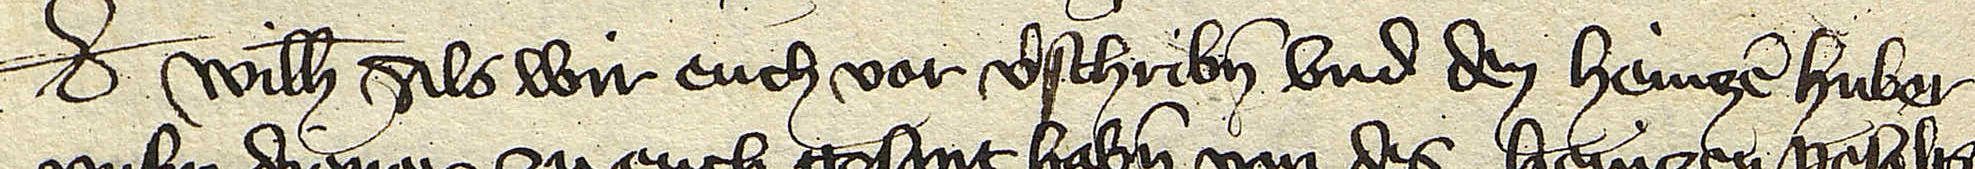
L* wilh* / Als wir euch vor v*ſchribn* vnd den heincʒe* huber
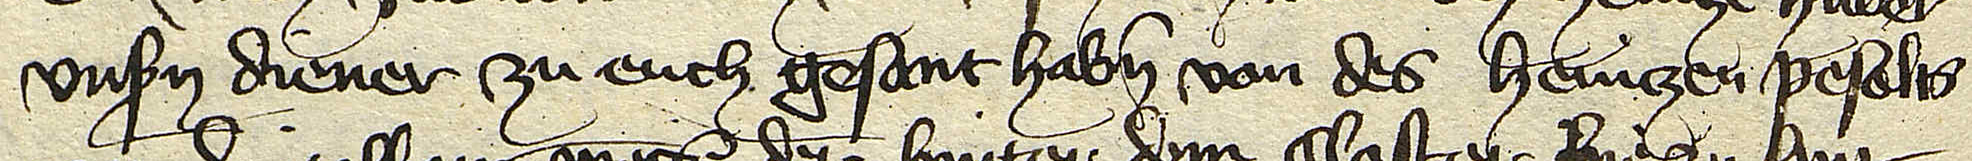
vnſ*n diener cʒu euch geſant habn* von des heincʒen peſolts
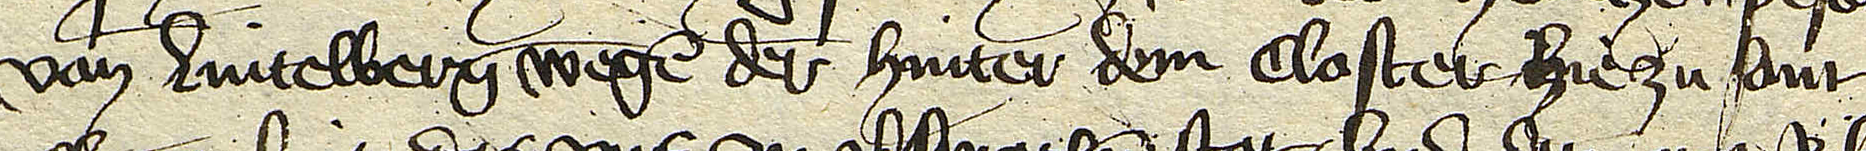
von Lintelberg wege* der hinter dem Cloſter hie cʒu ſant
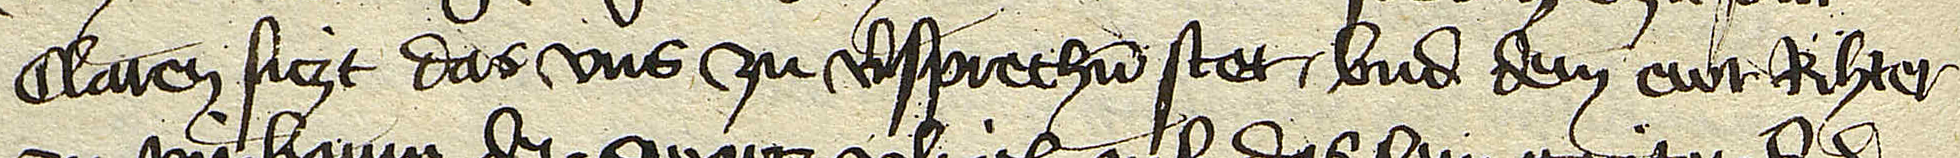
Claren ſicʒt das vns cʒu v*ſprechn*ſtet / vnd dem ewr Rihter
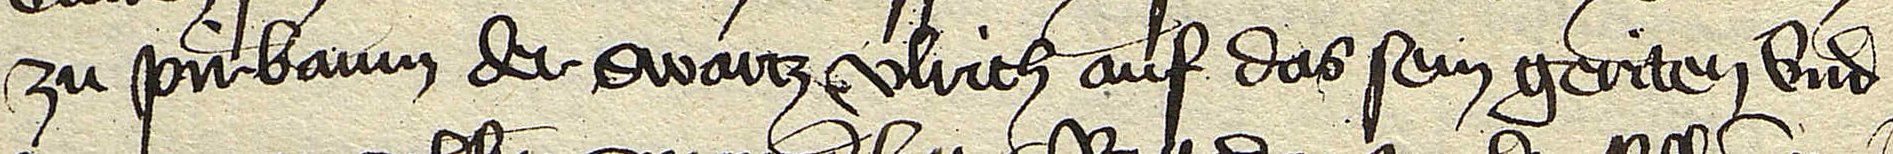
cʒu Pirbaum der Swarcʒ vlrich auf das ſein geriten vnd
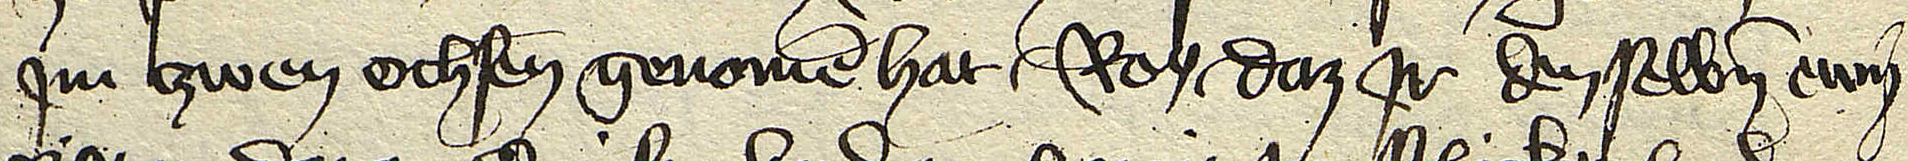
Im cʒwen Ochſen genome* hat / Ro* / daʒ Ir denſelbn* ewn*
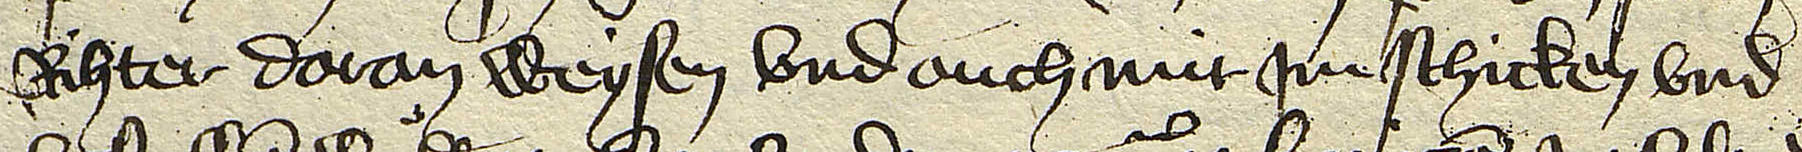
Rihter daran weiſen vnd auch mit Im ſchicken vnd
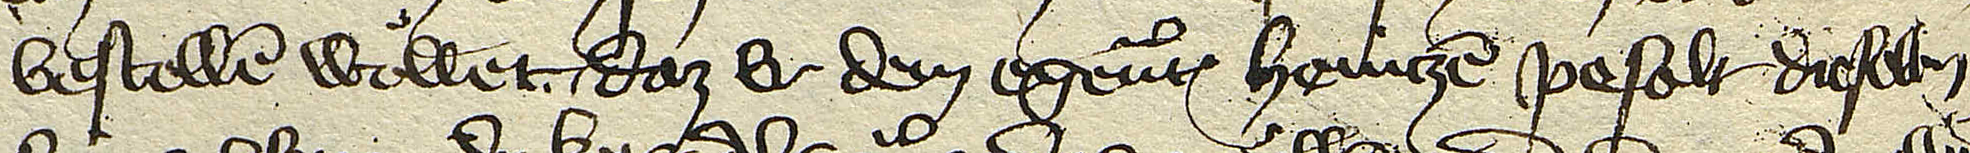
beſtelle* wöllet / daʒ Er dem egent* heincʒe* peſolt dieſelbn*
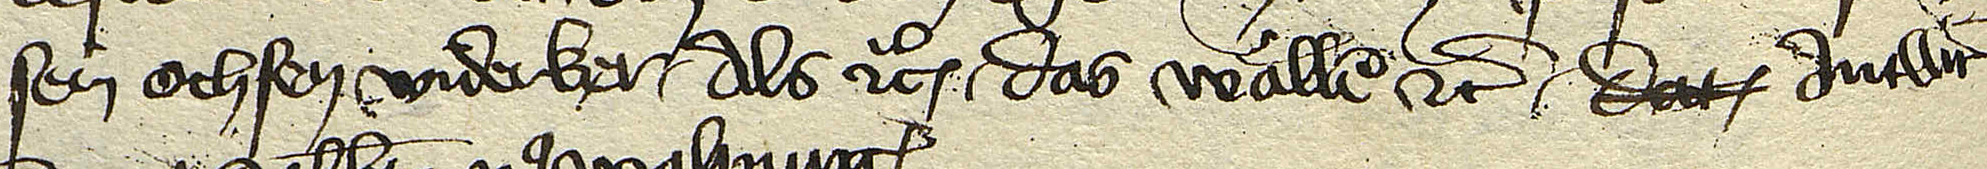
ſein Ochſen widerker / Als ec* / das wölle* ec* / Dat* Antw*t
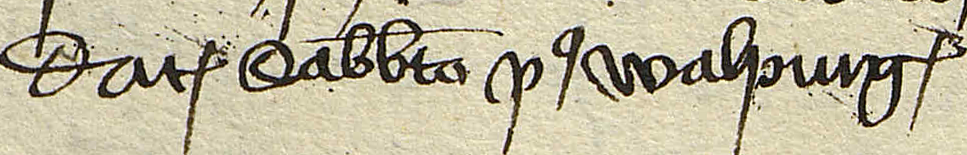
dat* Sabbto* p* walpurg*
